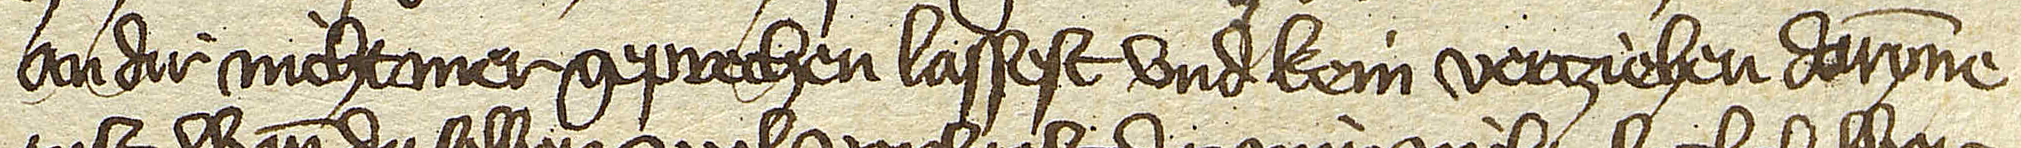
an dir nicht mer geprechen laſſeſt vnd kein vercʒiehen daryne*
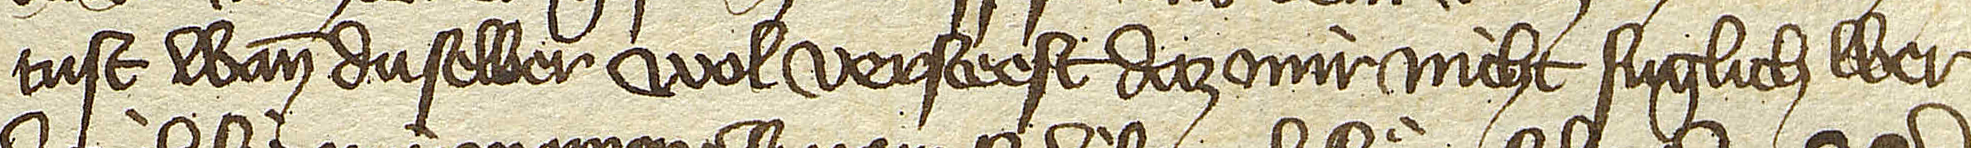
tuſt wan* du ſelber wol verſteeſt daʒmir nicht fuglich wer
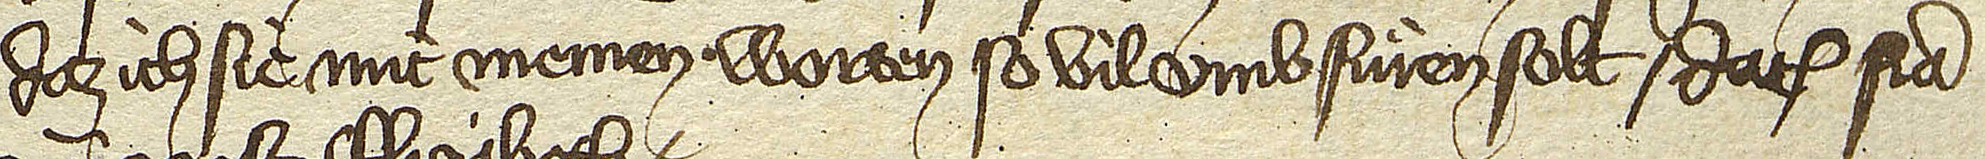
daʒ ich ſie mit meinen worten ſo vil vmb füren ſolt / dat* fia*
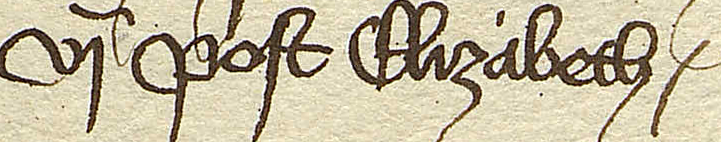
vi* poſt Eliʒabeth /
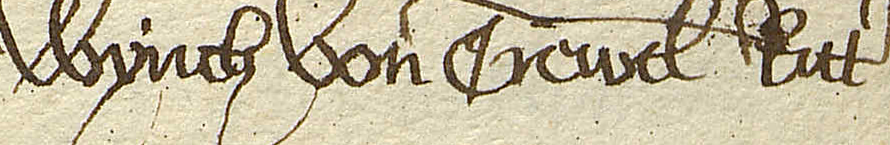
Wyrich von Trewtl* Ritt*
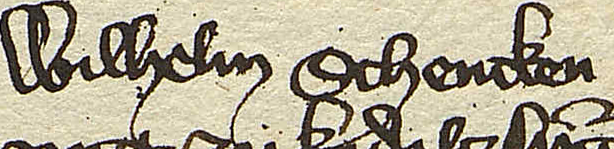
wilhelm Schencken
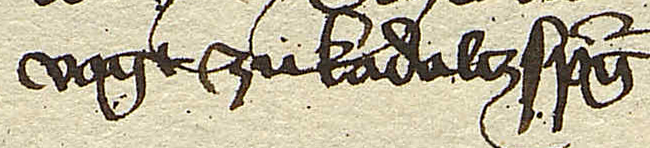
vogt cʒu kadolcʒſp*g
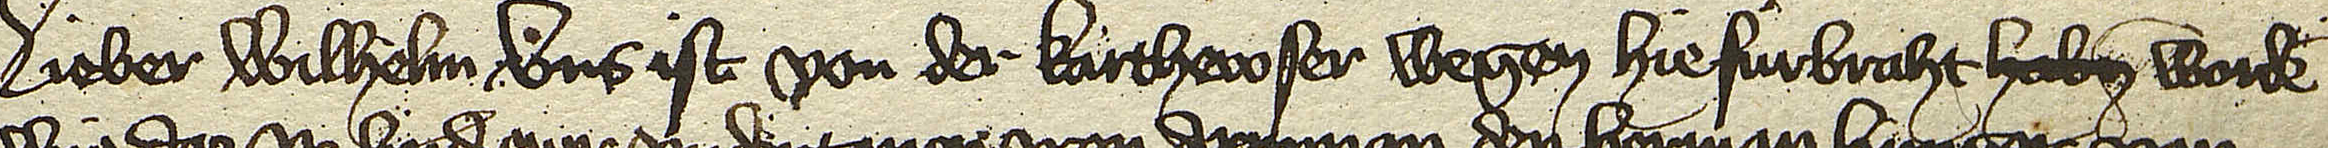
Lieber Wilhelm / vns iſt von der karthewſer wegen hie fürbraht habn* worde*
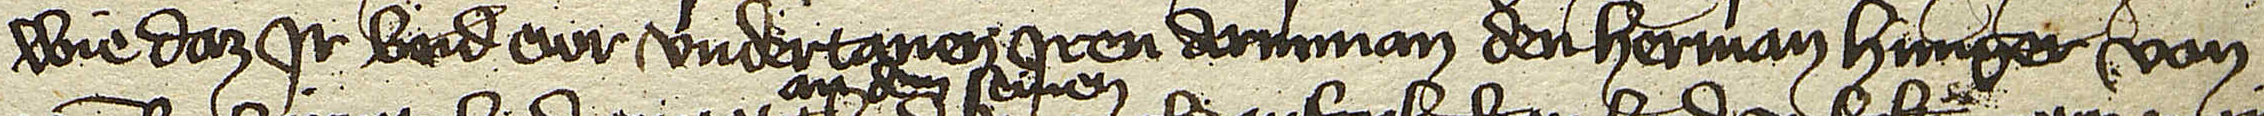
wie daʒ Ir vnd ewr vndertanen Iren Armman den herman hunger von
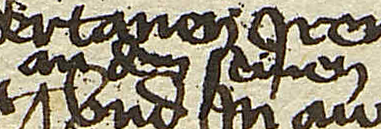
an dem ſeinen
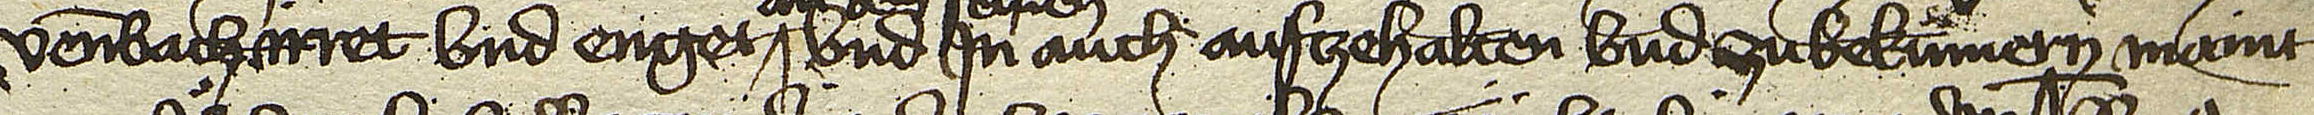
ven*bach irret vnd enget vnd In auch aufcʒehalten vnd cʒu bekumern maint
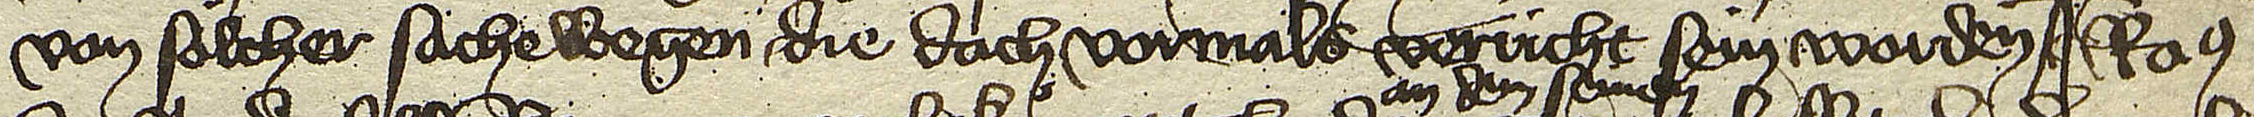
von ſölicher ſache wegen / die doch vormals veruicht ſein worden / Ro*
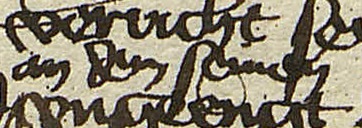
an dem ſeinen
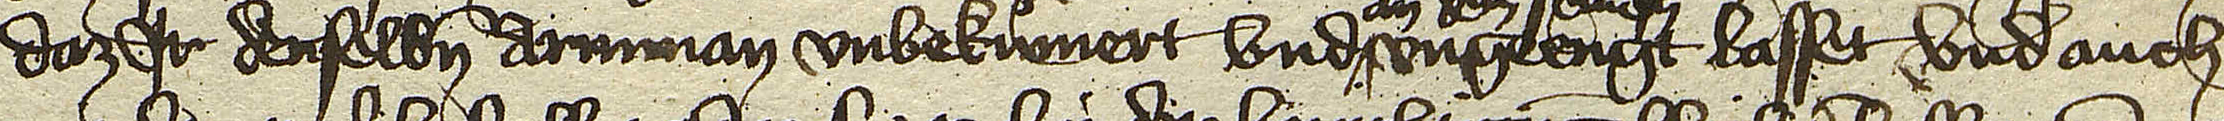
daʒ Ir denſelbn* Armman vnbekümert vnd vngelengt laſſet / vnd auch
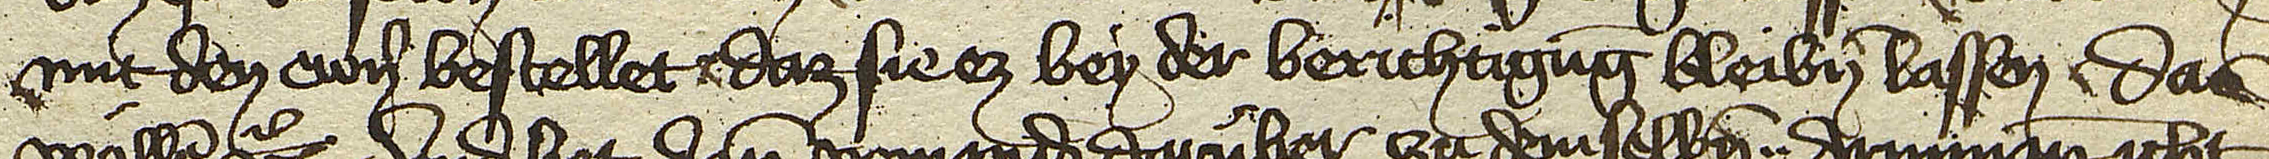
mit den ewn* beſtellet / daʒ ſie eʒ bey der berichtigug* bleibn* laſſen / das
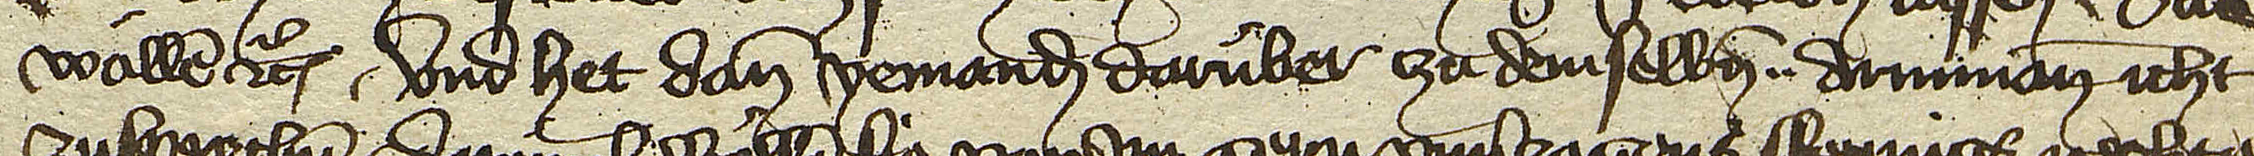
wölle* ec* / vnd het dan* yemand* darüber cʒu demſelbn* ~ Armman icht
